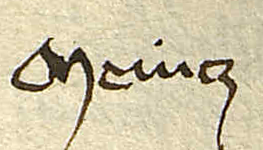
Meincʒ
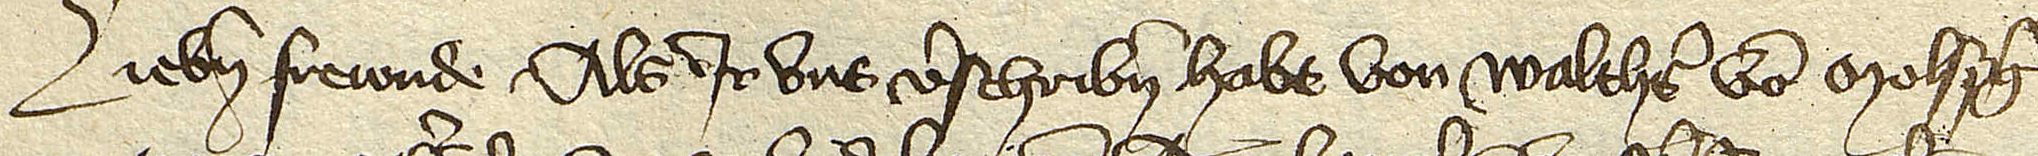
Liebn* frewnde / Als Ir vns v*ſchribn* habt von walths* vo* Molſpg*
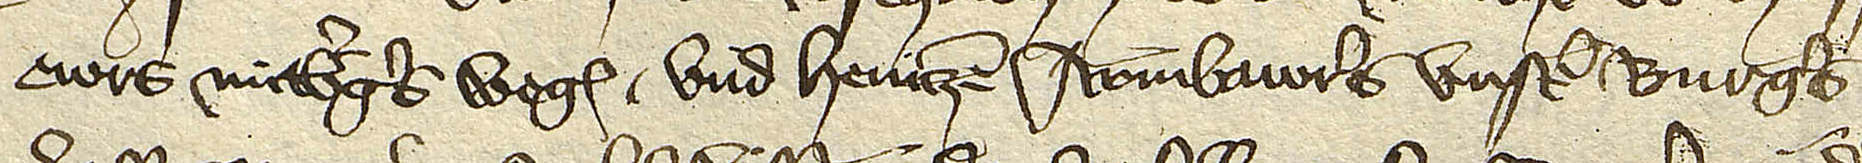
ewrs mitb*g*s weg* / vnd heincʒe* Armbawr*s vnſs* Burg*s
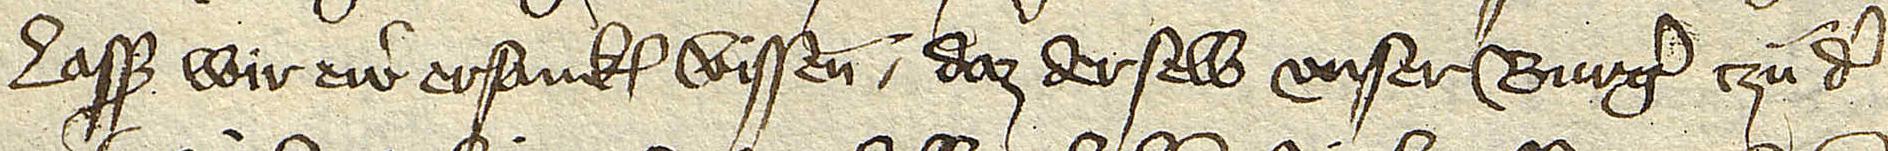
Laſſ* wir ew* erſamk* wiſſen / daʒ derſelb vnſer Burg* cʒü d*
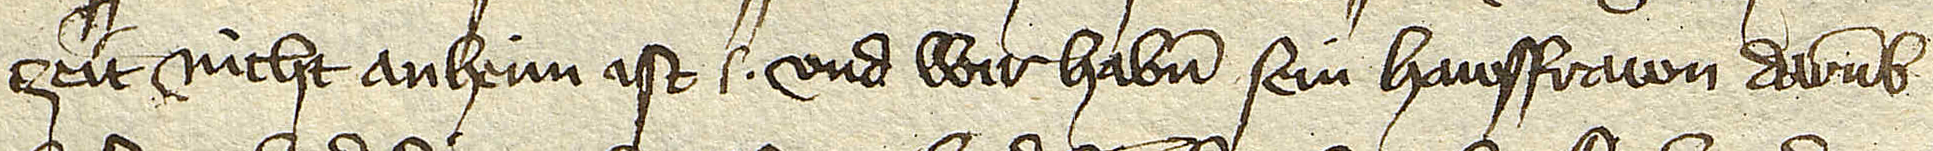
cʒeit nicht anheim iſt / . vnd wir habn* ſein hawſfrawn darub*
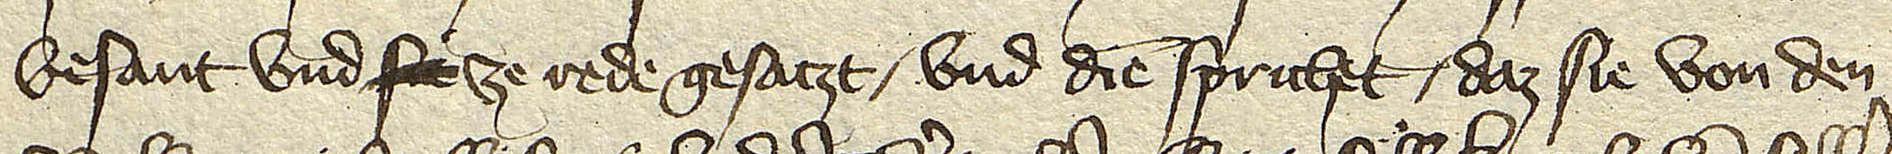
beſant vnd ſie cʒe rede geſacʒt / . vnd die ſprichet / daʒ ſie von den
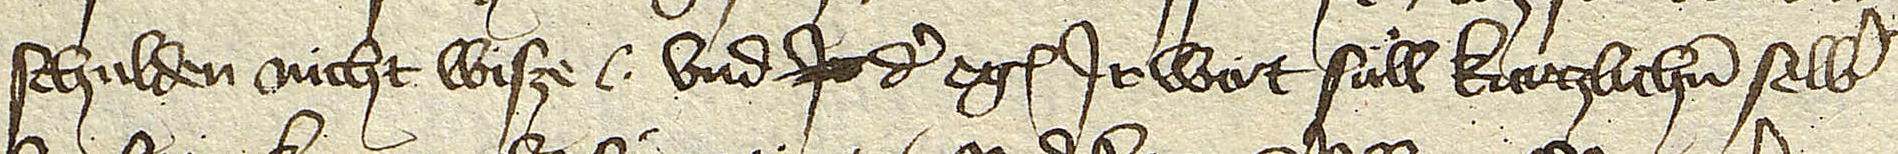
ſchulden nicht wiſʒe / . vnd Ir d* eg* Ir wirt ſüll kurcʒlichn* ſelb*
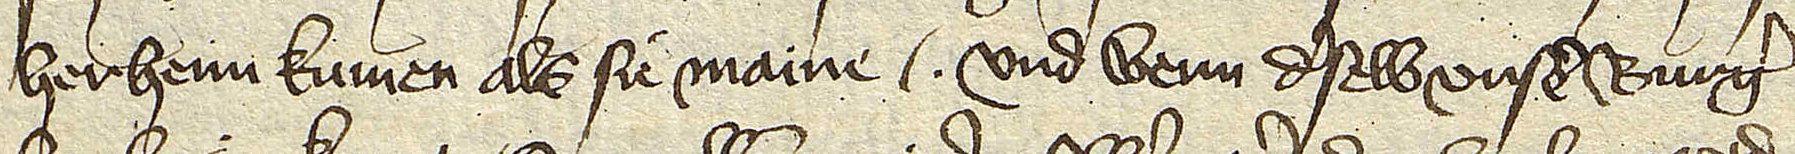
herheim kumen als ſie maine / . vnd wenn d*ſelb vnſe* Burg*
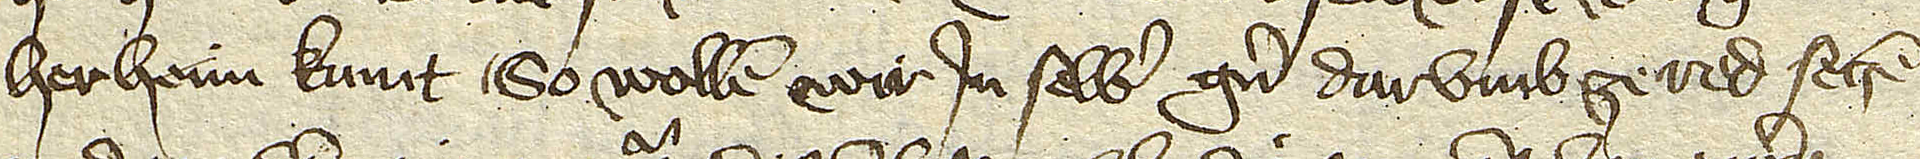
herheim kumt / So wolle* wir In ſelb* gn* darvmb cʒe red ſecʒe*
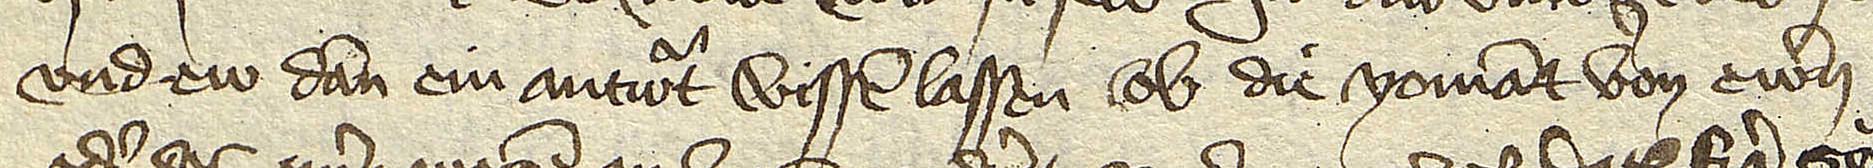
vnd ew dan* ein antw*t wiſſe* laſſen / ob die yema*t von ew*n
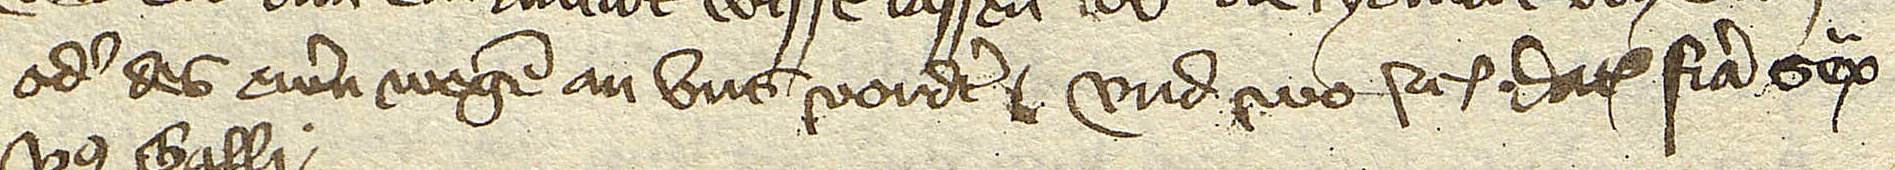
od* des ew*n wege* an vns vordt* / vnd wo ec* dat* fia* Sex*
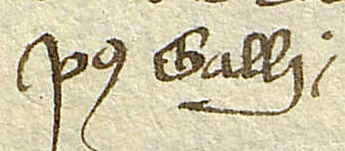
p* Galli* /
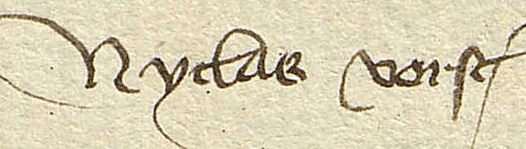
Nyclas vorſt*
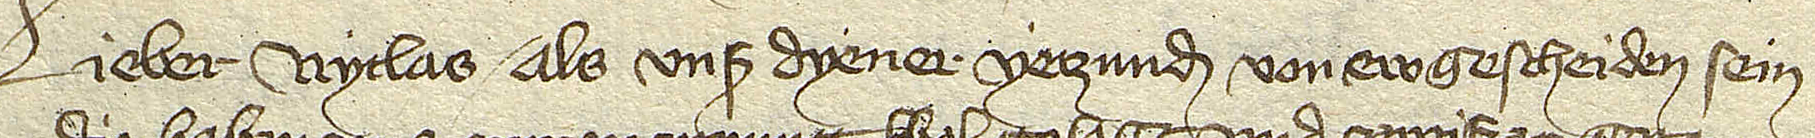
Lieber Nyclas / als vnſ* dyener yecʒund* von ew geſcheiden ſein
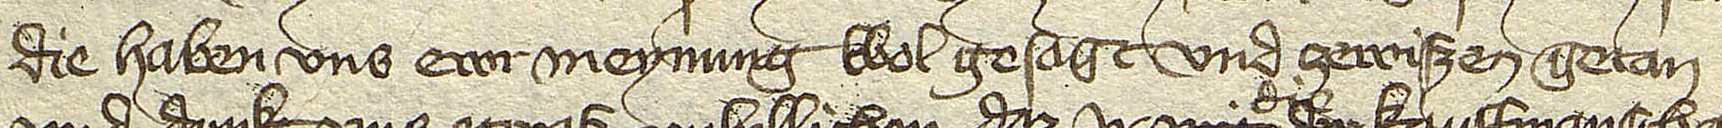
die haben vns ewr meynung wol geſagt vnd gewiſʒen getan
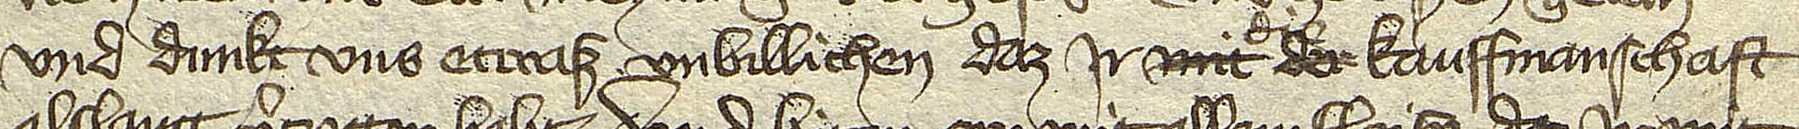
vnd dunkt vns etwaſʒ vnbillichen daʒ Ir mit der kauffmanſchaft
